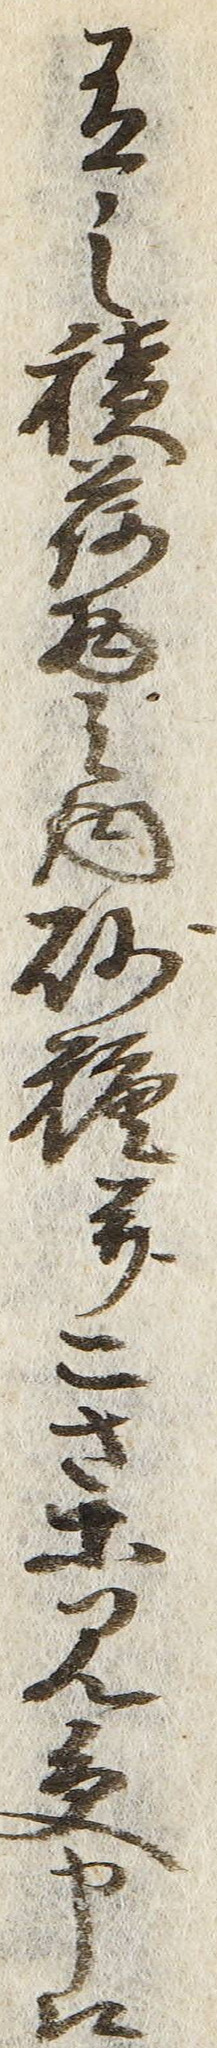有之積荷物之内砂糖幷こさ等見受申候
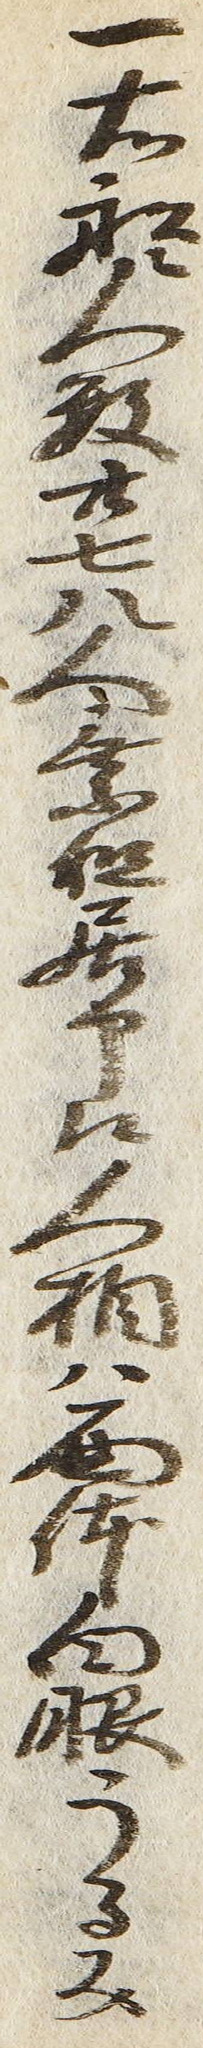一右舩人数廿七八人乗組居申候人相ハ面体白眼うるみ
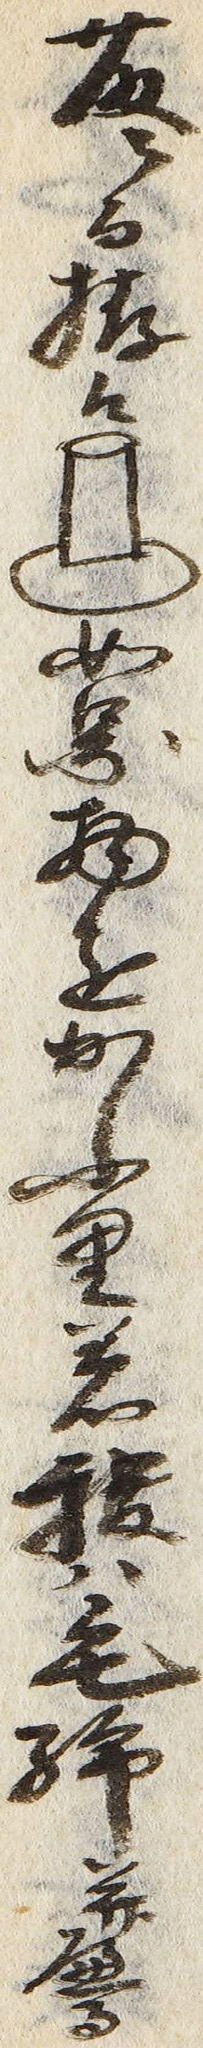藤ニ而拵候如圖物をかふり着服は毛綿幷扁る
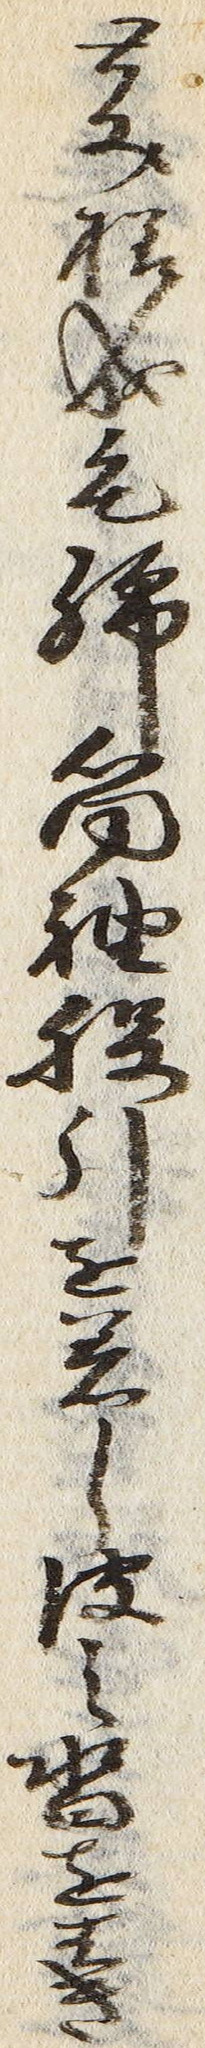とみ様成毛綿筒袖股引を着し皮の沓をはき
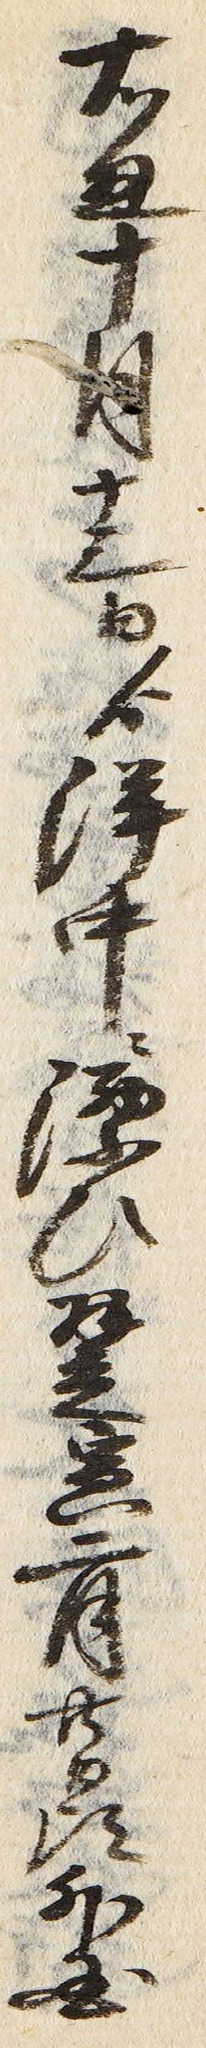右丑十月十三日ゟ洋中ニ漂ひ翌寅二月廿日頃外国
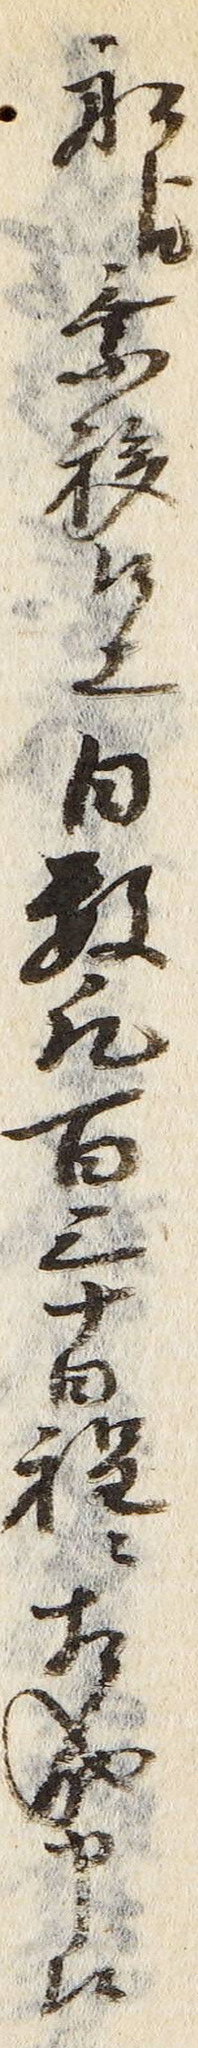舩江乗移候上日数凡百三十日程ニ相成申候
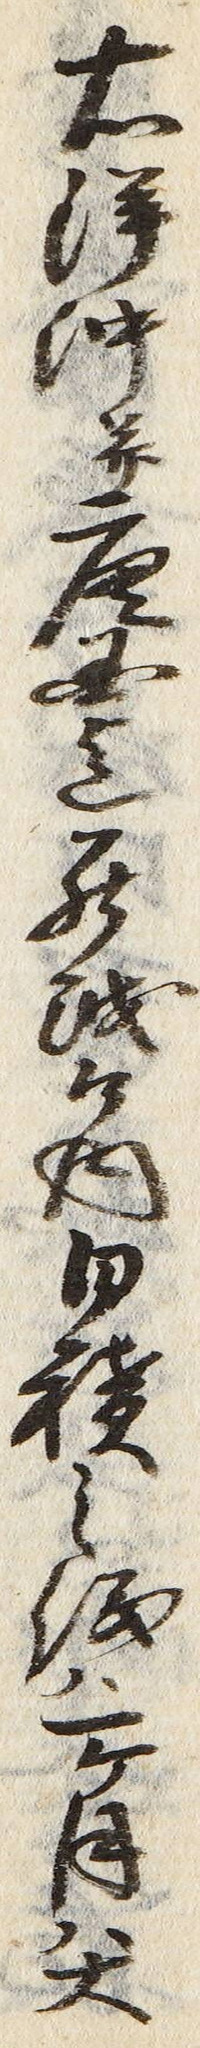右洋沖幷唐国迄罷越候内日積野之儀ハ一ケ月ハ大
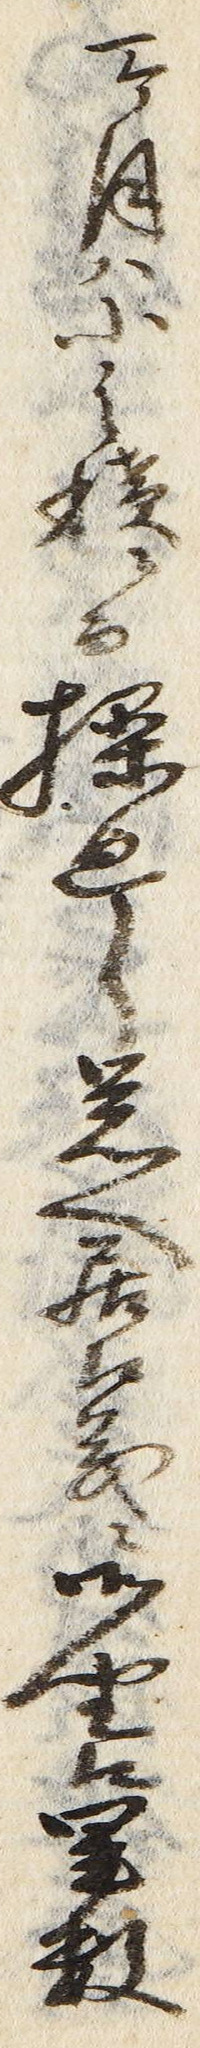一ケ月ハ小之積ニ而操廻し覚へ居候義ニ御座候里数
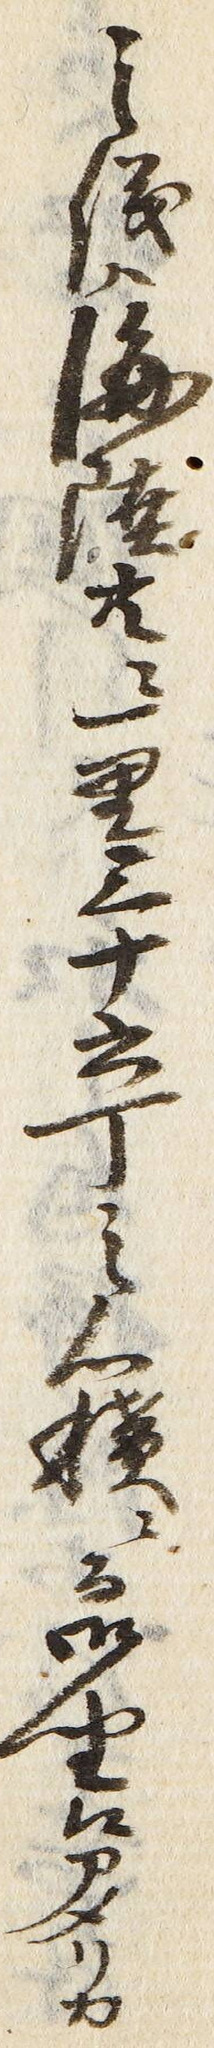之儀ハ海陸共ニ一里三十六丁之心積ニ而御座候アメリカ
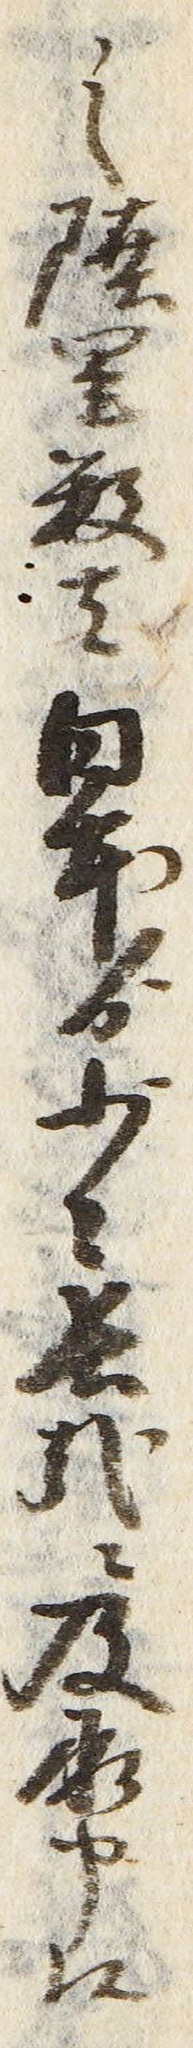之陸里数者日本ゟ少々長哉ニ及承申候
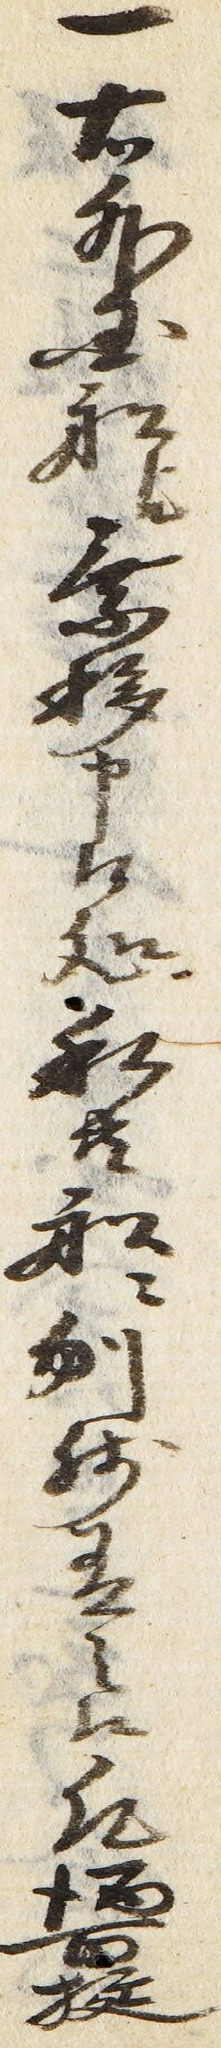一右外国舩江乗移申候処私共舩ニ刎残有之候凡酒百挺
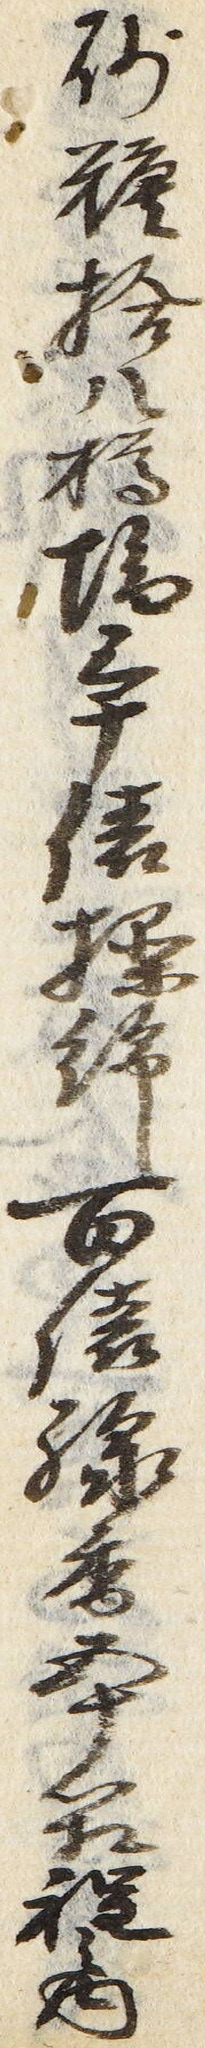砂糖拾八樽塩五十俵操綿百俵線香五十箱程之内
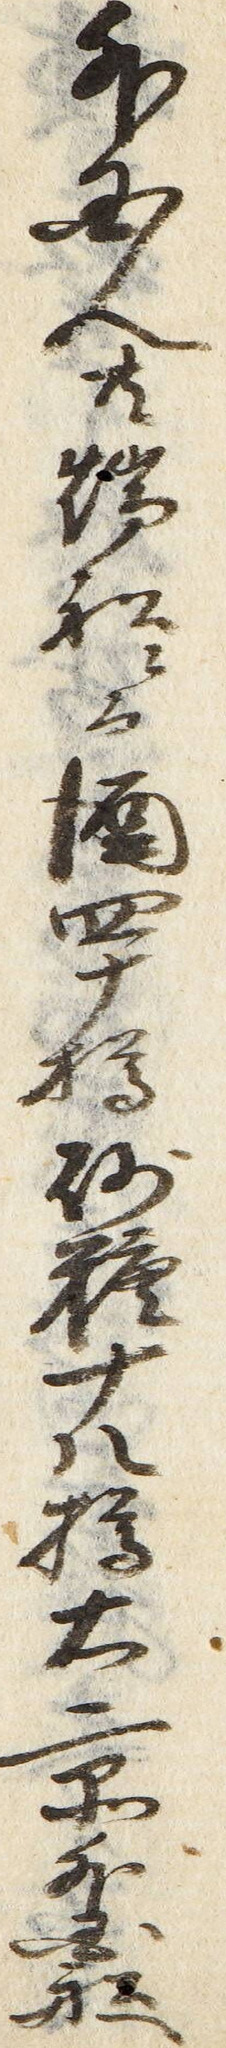外国人共端舩ニ而酒四十樽砂糖十八樽右二品外国舩へ

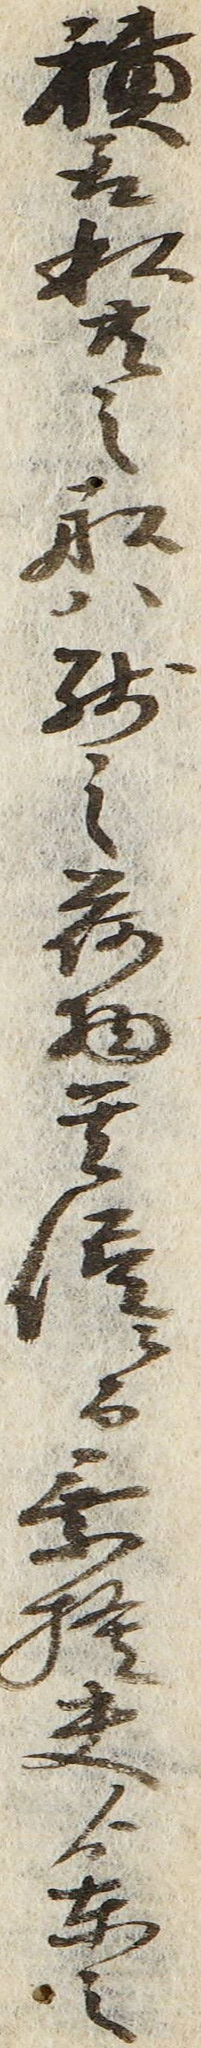積取私共之舩ハ残之荷物其儘ニ而乗捨夫ゟ東之
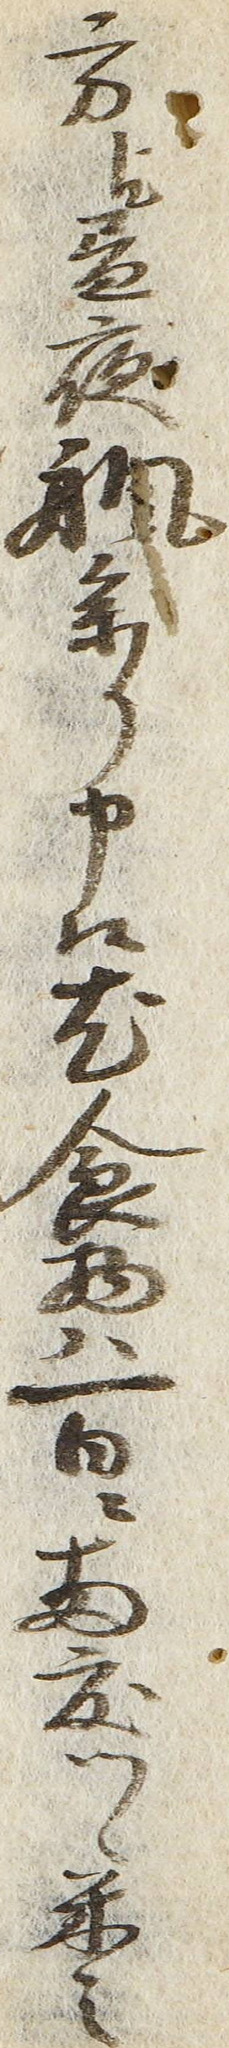方江晝夜䑺参り申候尤食物ハ一日ニ両度ツヽ米之
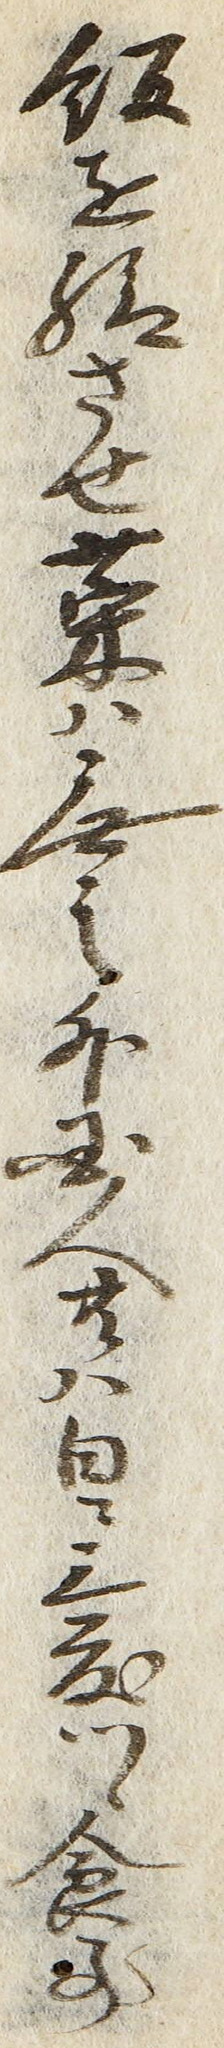飯を給させ菜ハ無之外国人共ハ日ニ三度ツヽ食事
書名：漂流人善助聞書
